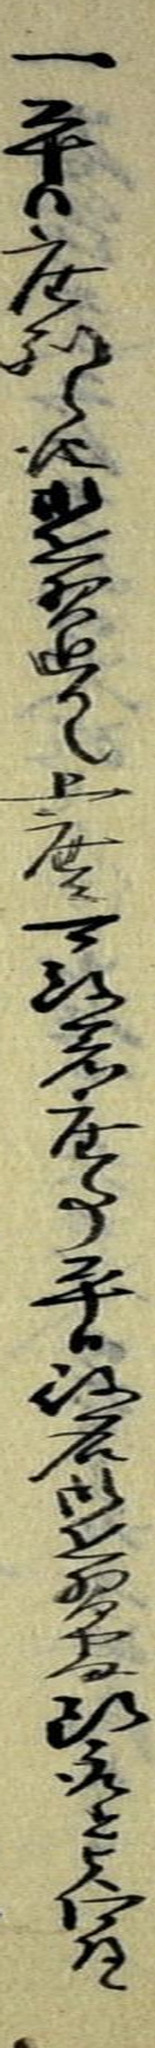一平日座列之儀御近習廻り之上座に可致着座事平日役名御近習番頭取と被仰付候
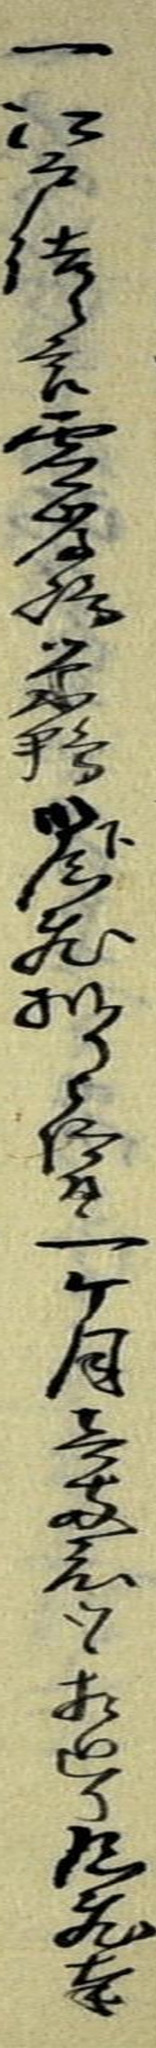一江戸詰之節霊岸嶋巣鴨御下屋敷掛り被仰付候一ヶ月壱両度ツヽ相廻り屋敷奉
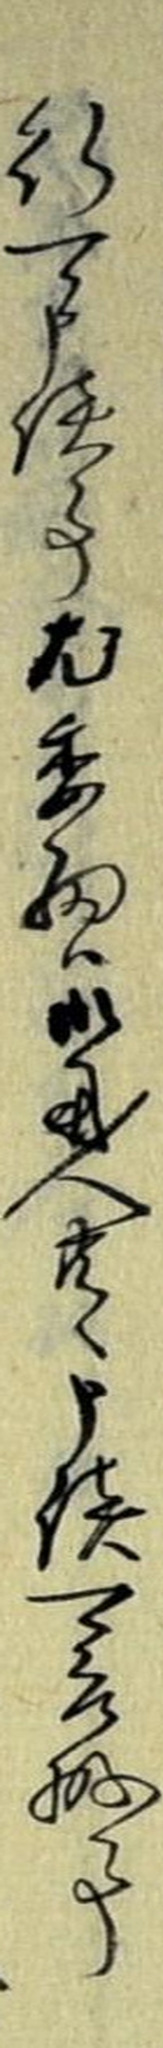行可申談事尤委細は御用人共へ申談可取扱事
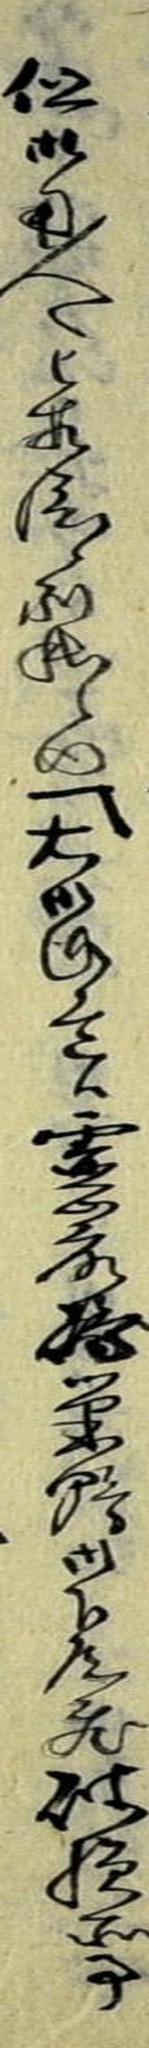但御用人へ被相渡候別紙之内〽右御趣意は霊岸嶋巣鴨御下屋敷破損所事
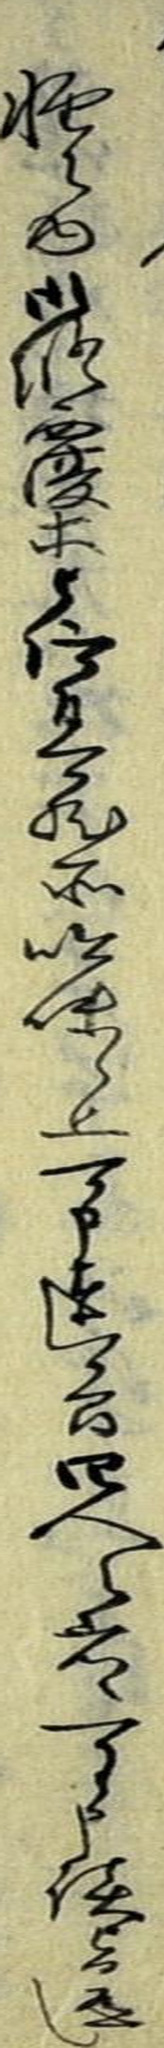軽之内御修覆等被仰付可然所吟味之上可申達候間四人之者へ可被申談旨有之
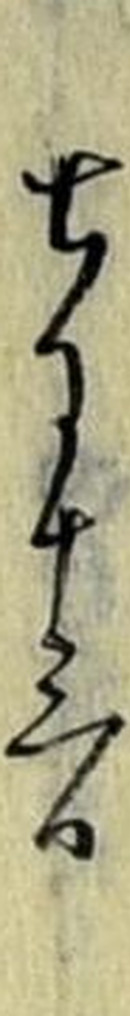七月十三日
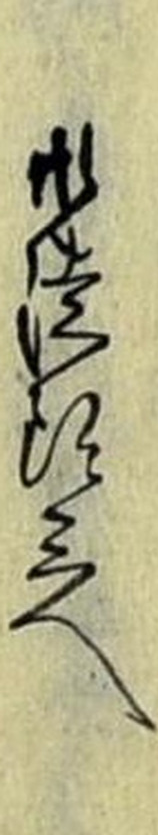御徒頭三人
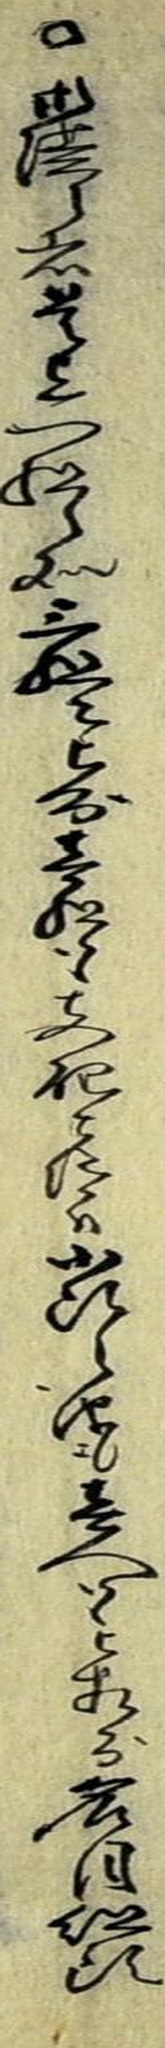〇御徒之者是迄一組之処三組に被分壱組ツヽ支配被仰付小頭之儀も壱人ツヽ被相分名目組頭
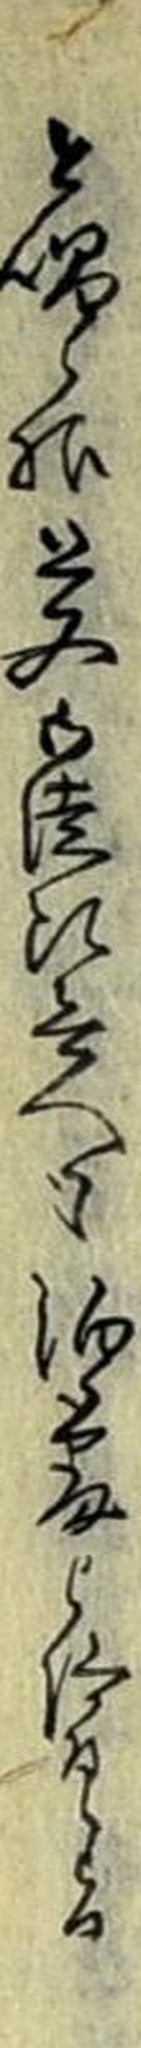と唱候様且又御徒頭壱人ツヽ泊番被仰付候旨
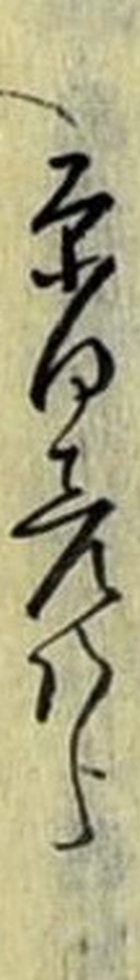原田彦八郎
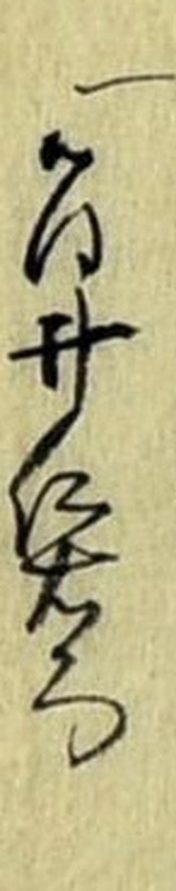筒井仁右衛門
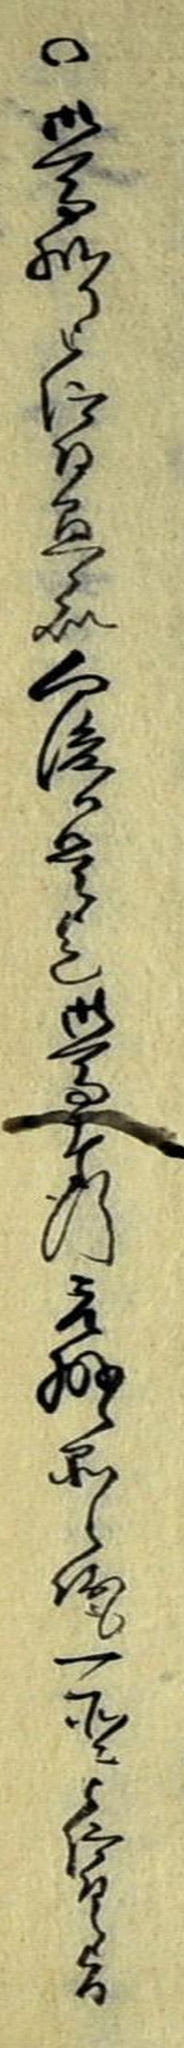〇御馬掛り被仰付置候処向後は是迄御馬奉行取扱候品之儀も一所に被仰付候旨

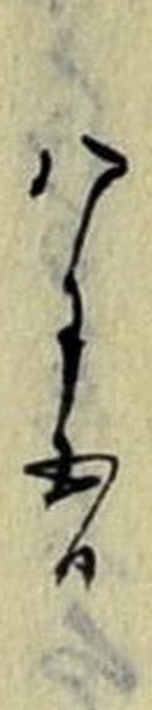八月五日
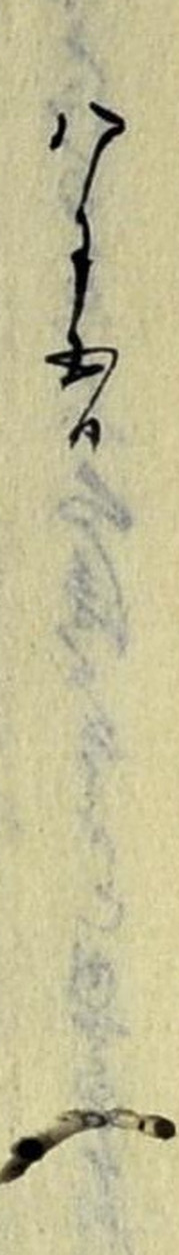八月五日
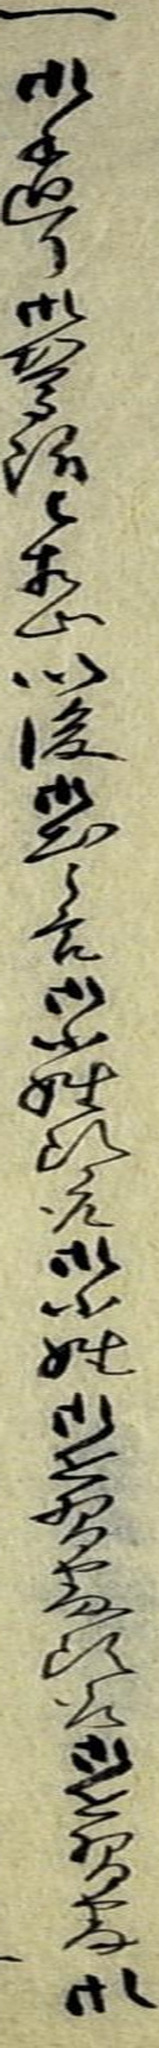一御手廻り御駕附被相止以後御出之節御小姓頭取御小姓御近習番頭取御近習番御
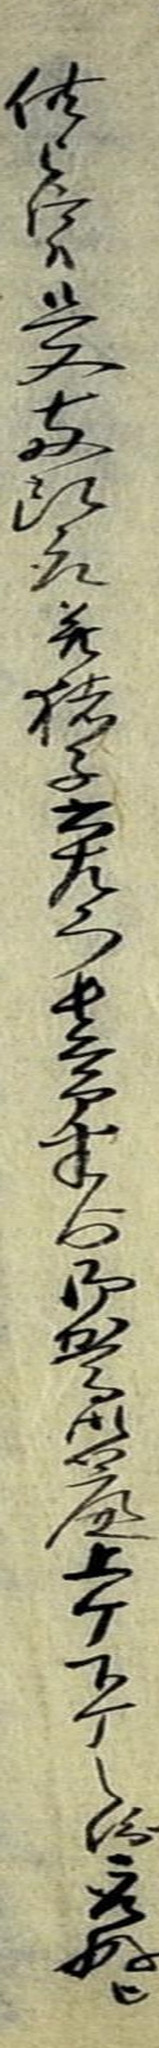供被仰付且又両頭取并猪子六左衛門長谷部半右衛門御駕御簾上ケ下ケ之儀取扱被
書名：命令之部 二
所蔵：福井県文書館 Fukui Prefectural Archives
